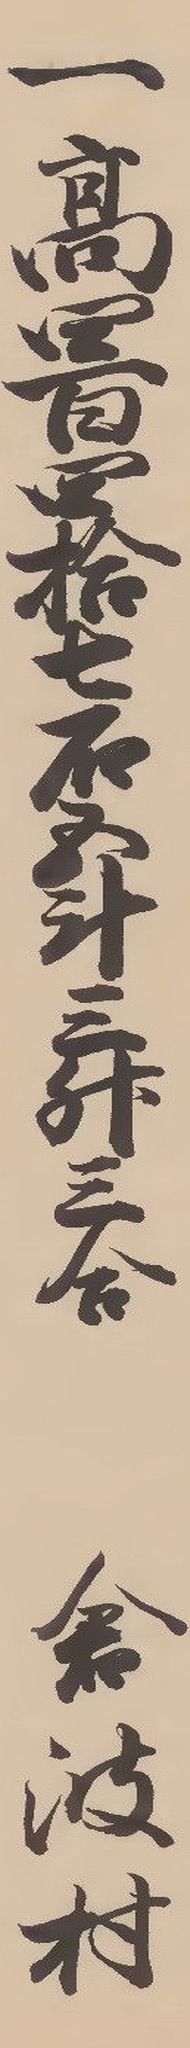一高四百四拾七石五斗三升三合倉波村
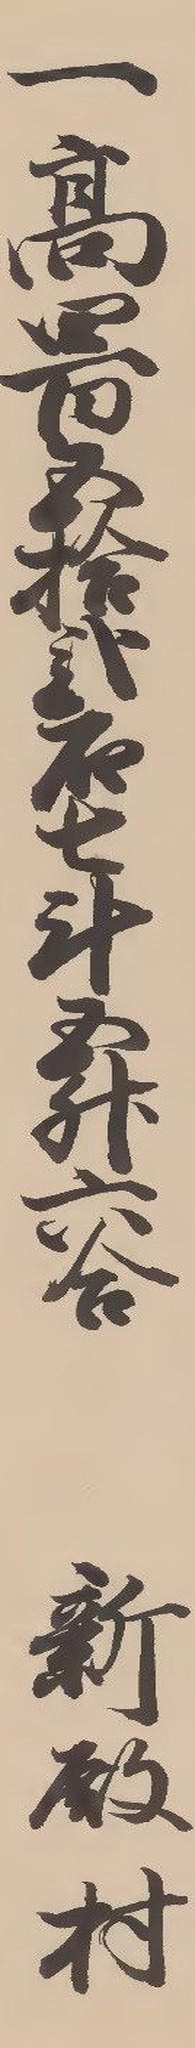一高四百五拾弐石七斗五升六合新殿村
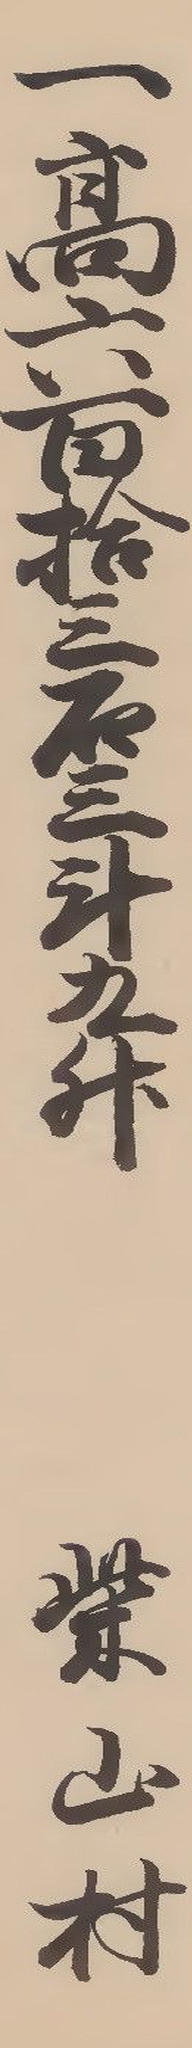一高六百拾三石三斗九升柴山村
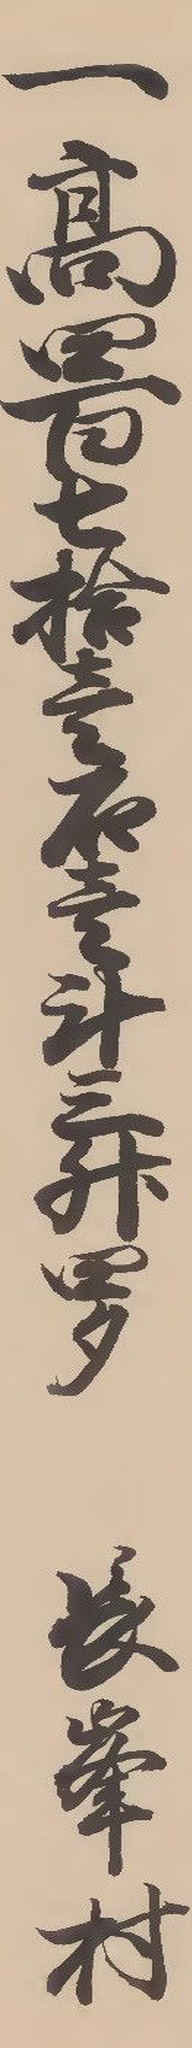一高四百七拾壱石壱斗三升四勺長峰村
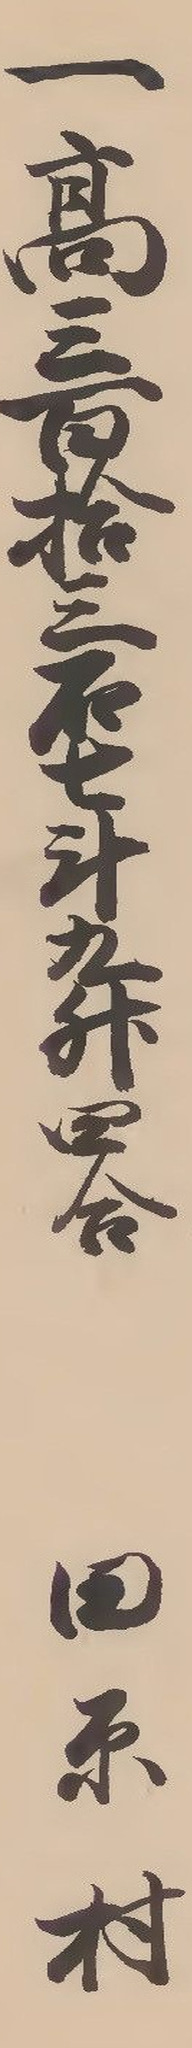一高三百拾三石七斗九升四合田原村

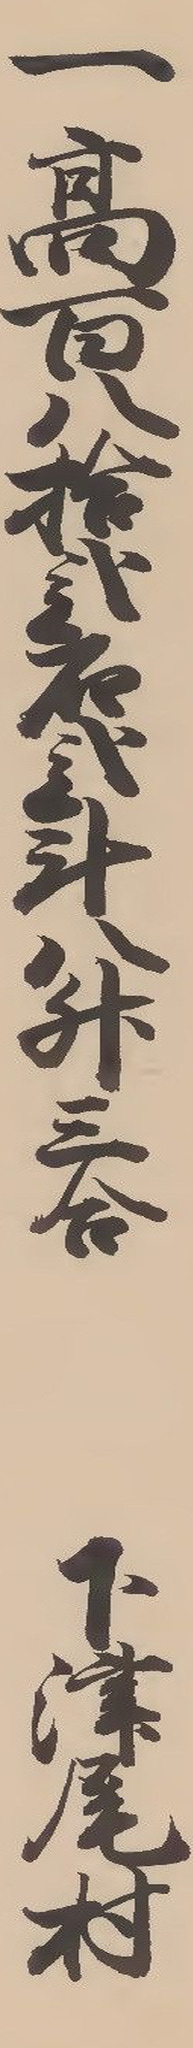一高百八拾弐石弐斗八升三合下津尾村
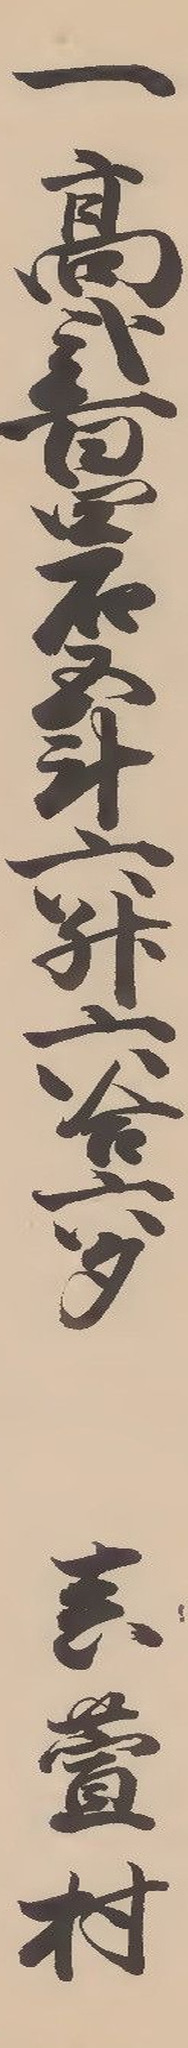一高弐百四石五斗六升六合六勺真萱村
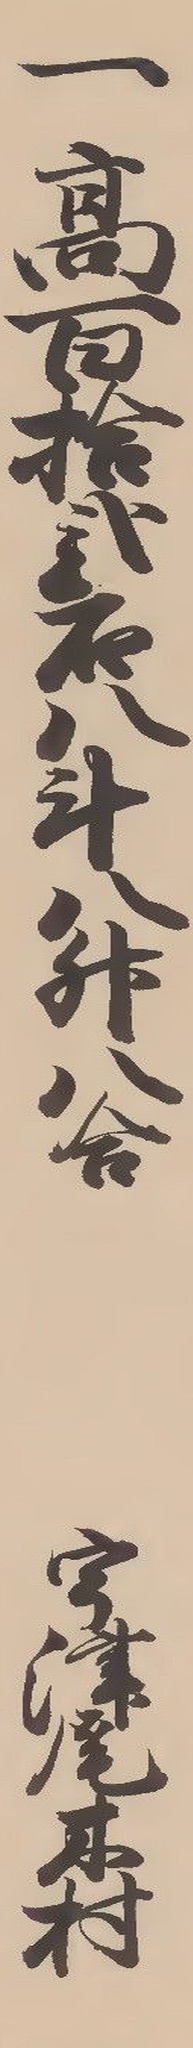一高百拾弐石八斗八升八合宇津尾木村
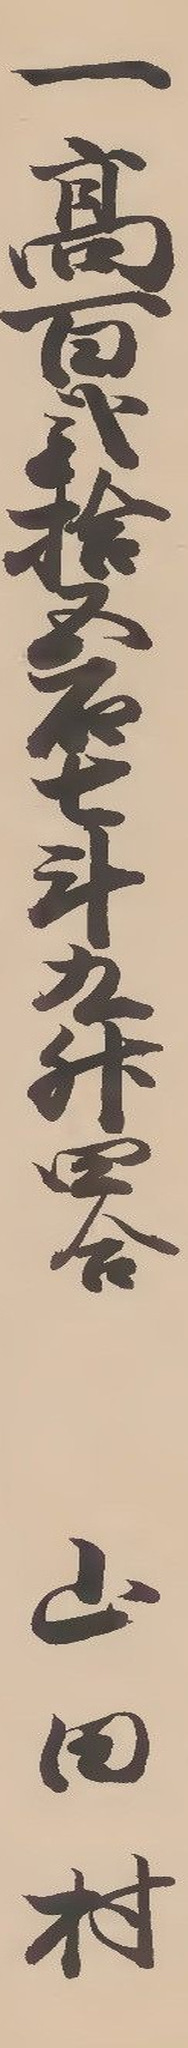一高百弐拾五石七斗九升四合山田村
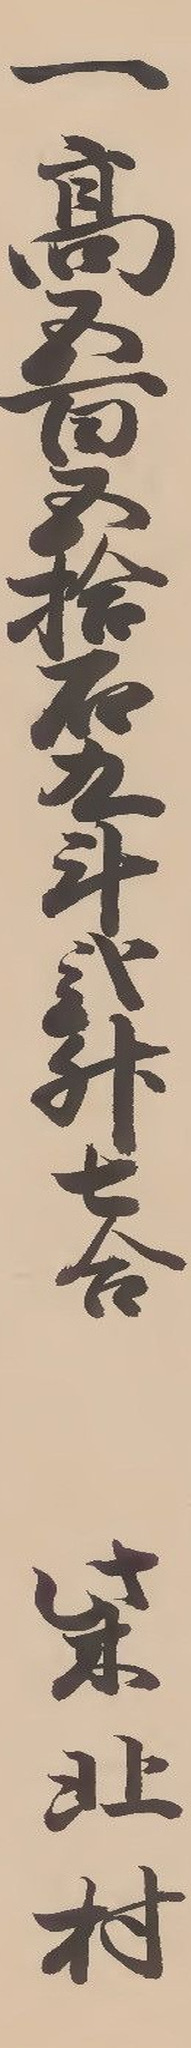一高五百五拾石九斗弐升七合柴北村
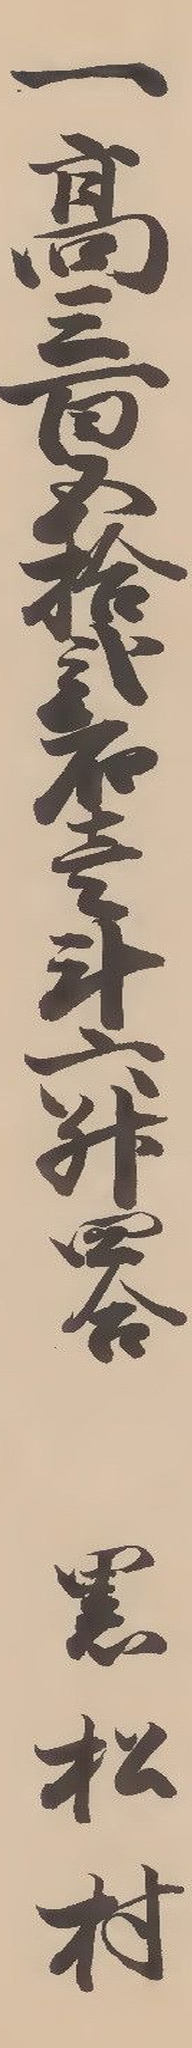一高三百五拾弐石壱斗六升四合黒松村
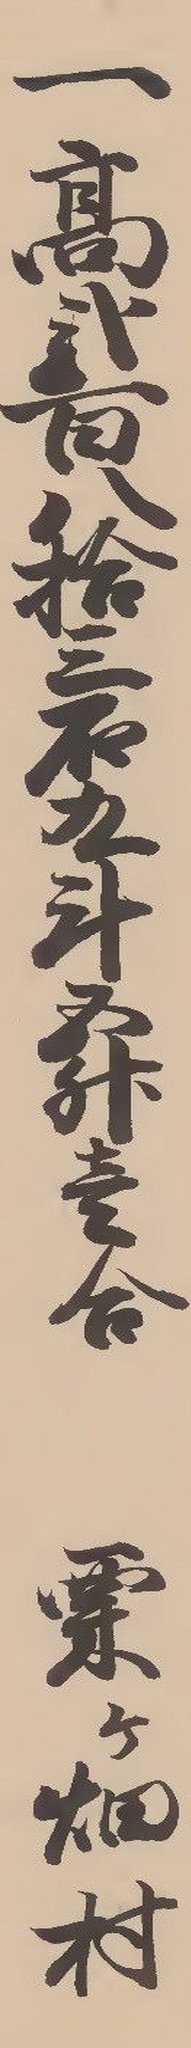一高弐百八拾三石九斗五升壱合栗ヶ畑村
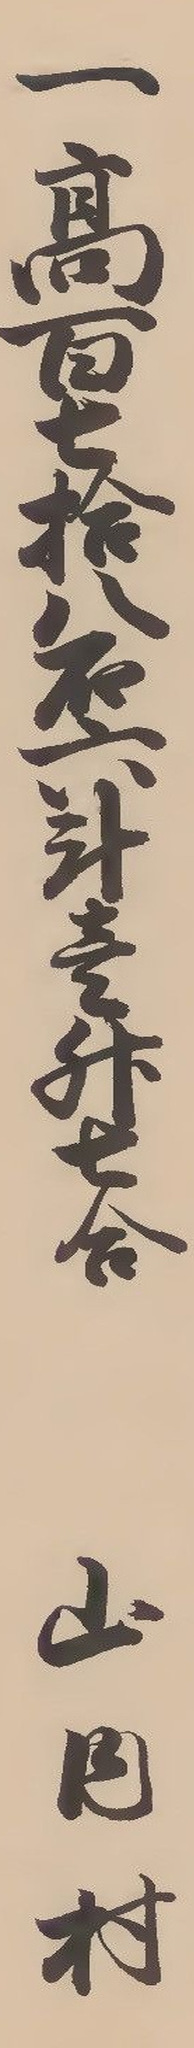一高百七拾八石六斗壱升七合山内村

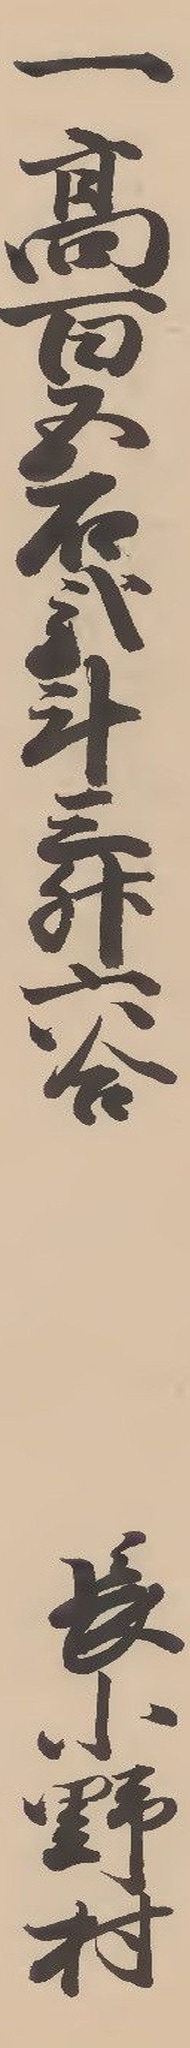一高百五石弐斗三升六合長小野村
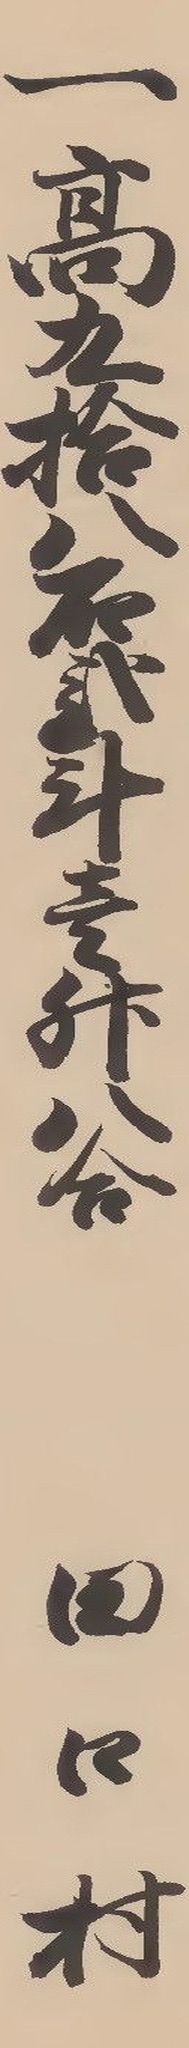一高九拾八石弐斗壱升八合田口村
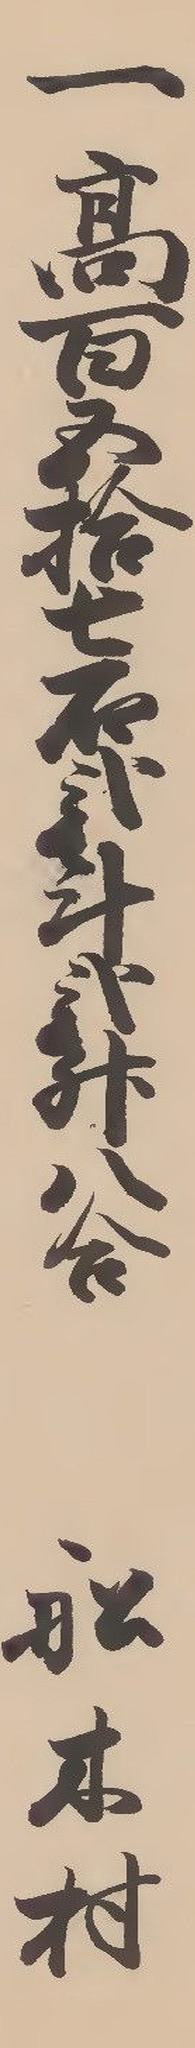一高百五拾七石弐斗弐升八合船木村
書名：豊後国郷帳
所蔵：国立公文書館 National Archives of Japan
